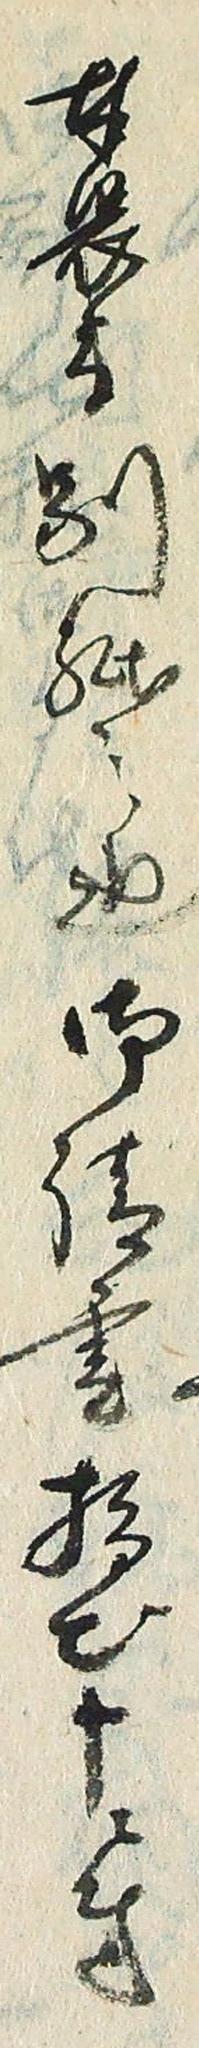奉畏旨別紙之通御請書指出申に付
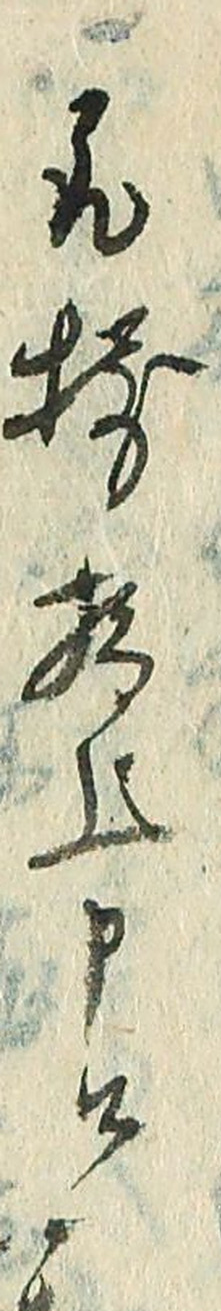取揃指上申候以上
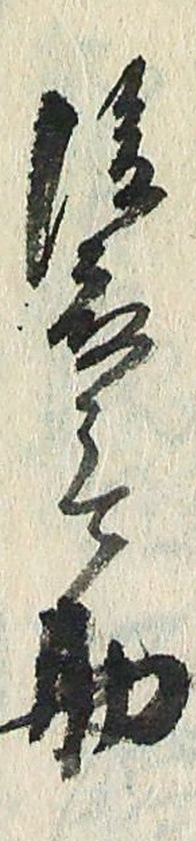後藤庄助
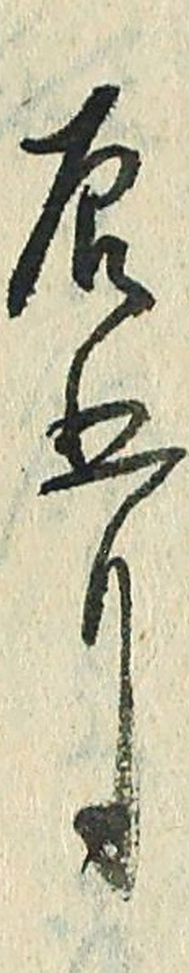辰五月
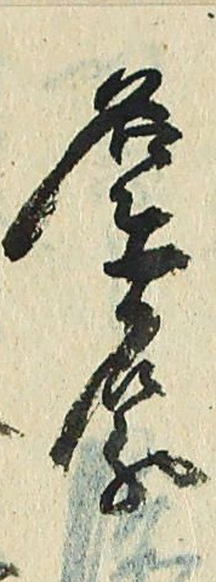名東名西
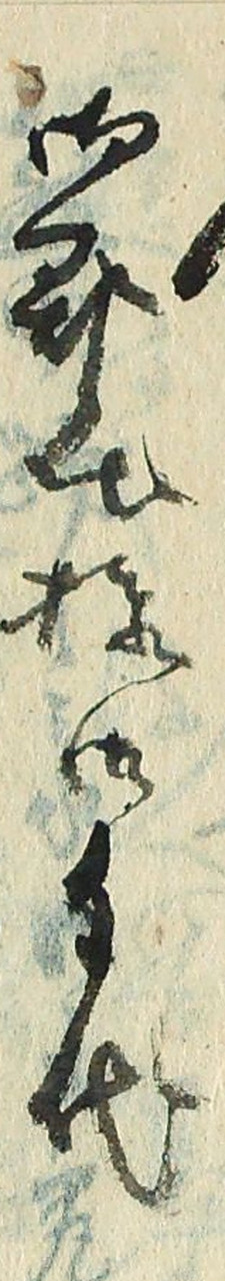御郡代様御手代
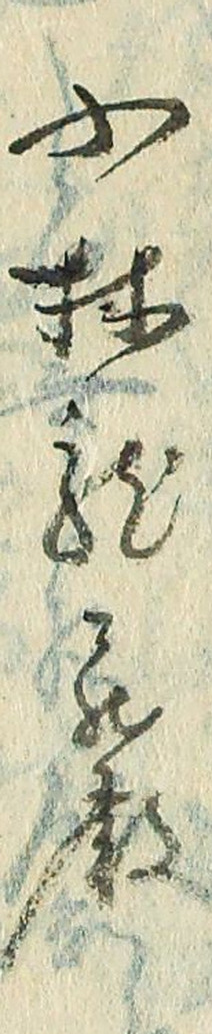小林龍蔵殿
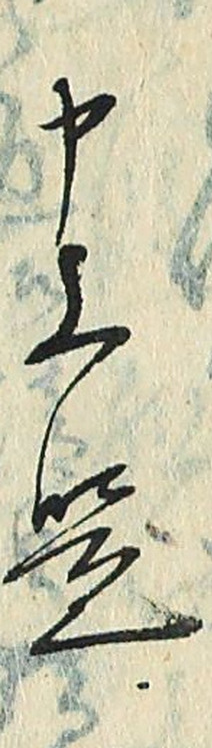申上覚
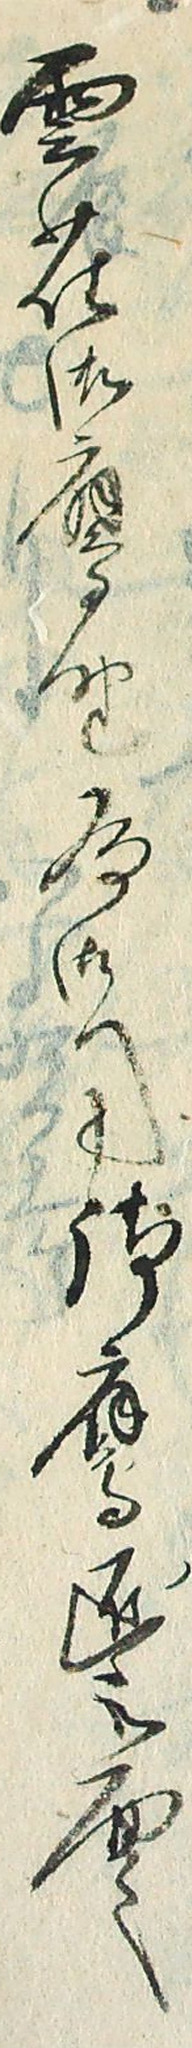雲雀御鷹野為御用御鷹匠之面々
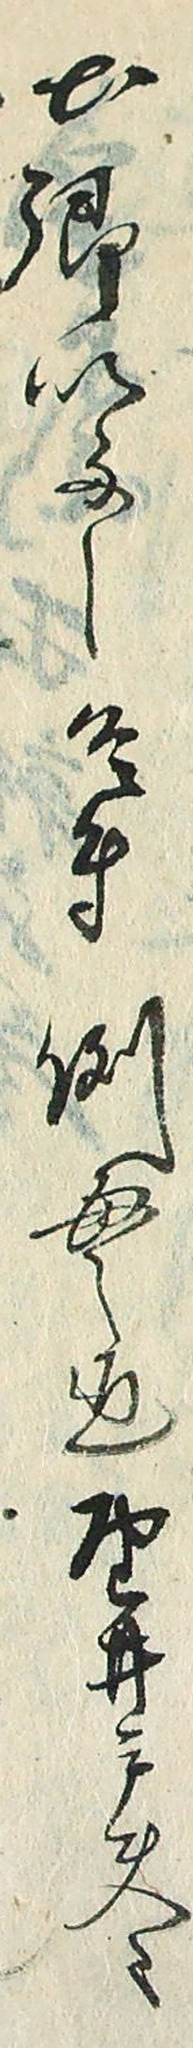出郷いたし候に付例毎之通野井戸夫々
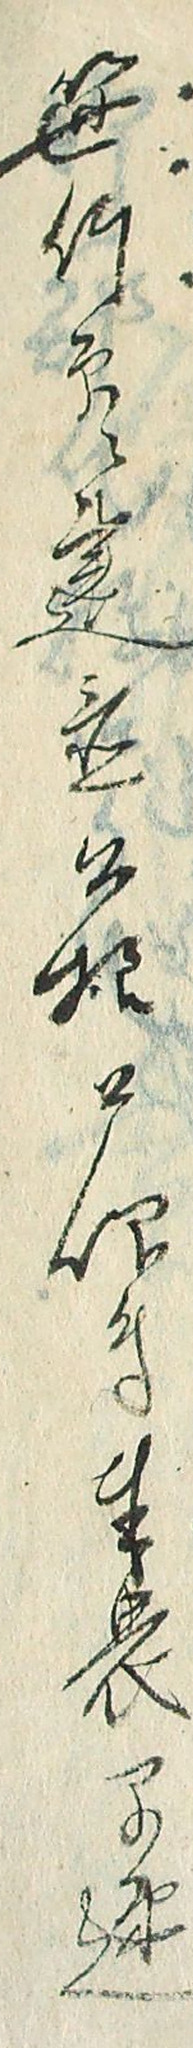笹竹印に建置候様被仰付奉畏早速

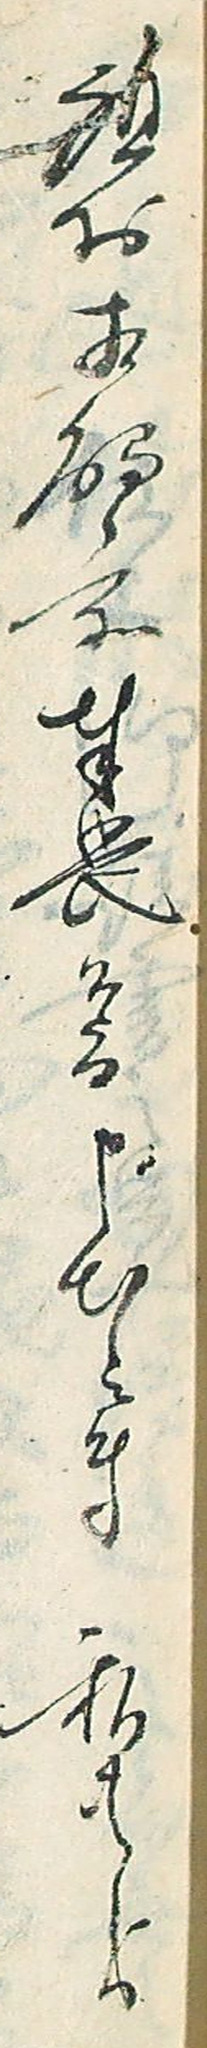組村相触候所奉畏候旨申出候に付私共ゟ
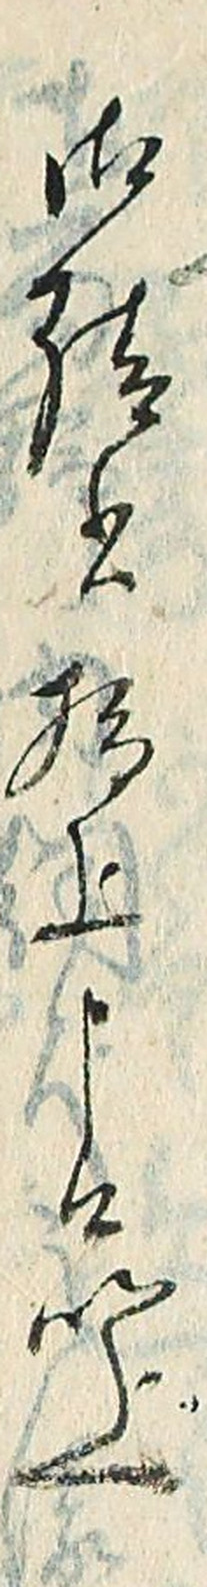御請書指上申候以上
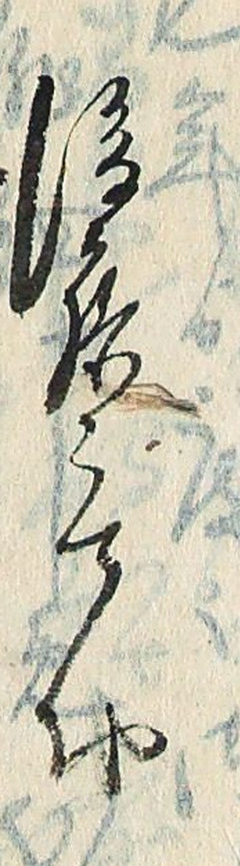後藤庄助
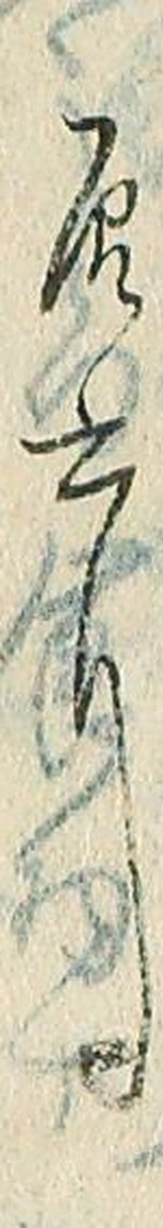辰六月
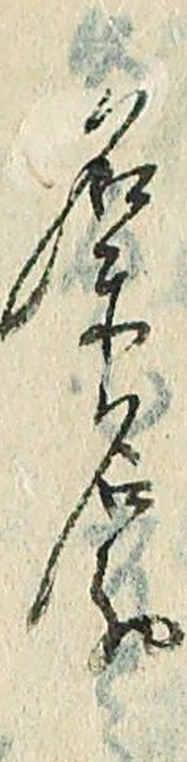名東名西
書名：諸御用御□受書控
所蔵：鳴門教育大学 Naruto University of Education
